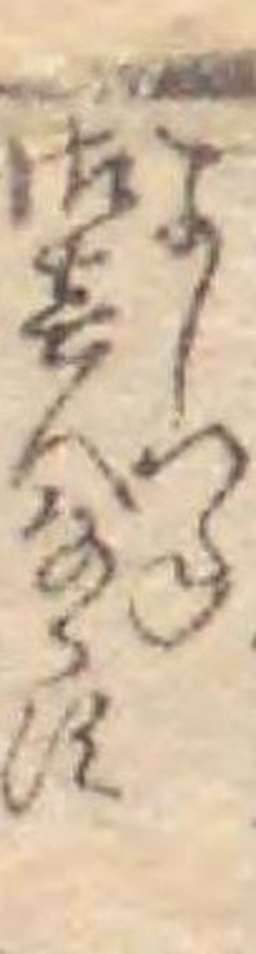御壱人ならす
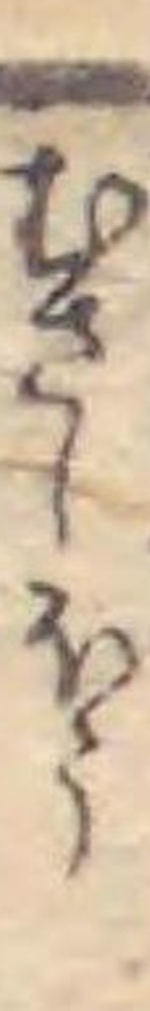むさしほう
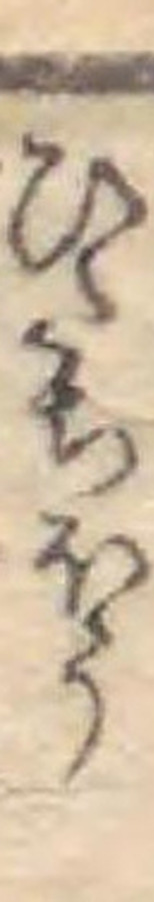ひたちほう
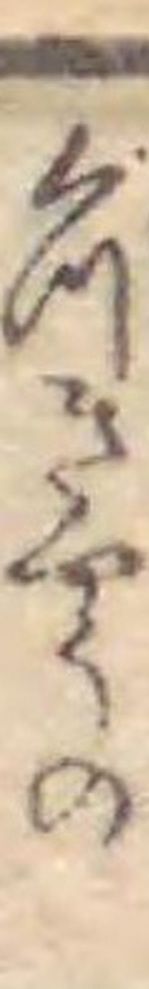くつきやうの
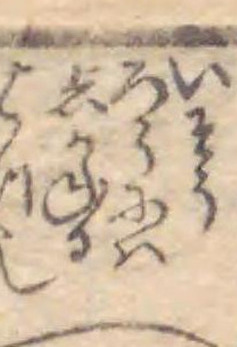しかねる

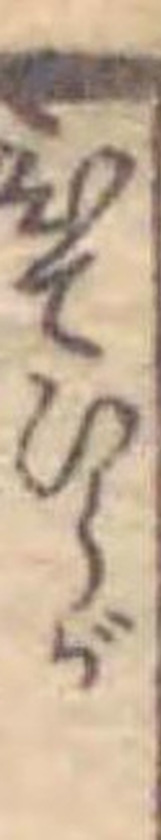ひてひらが
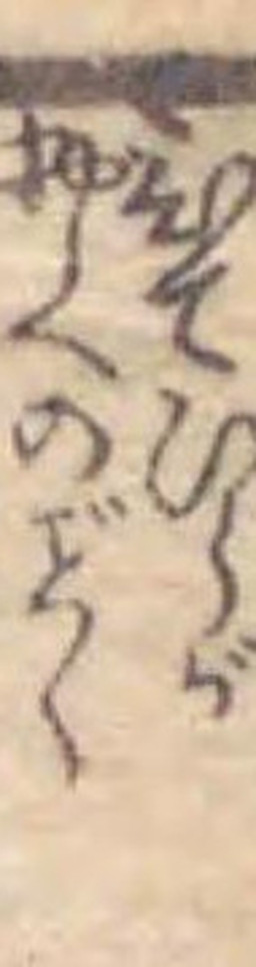おしへのごとく
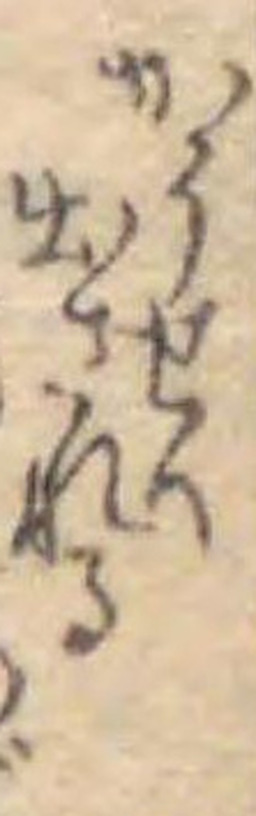出される
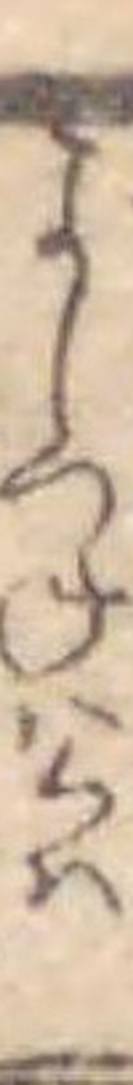よしつね公は
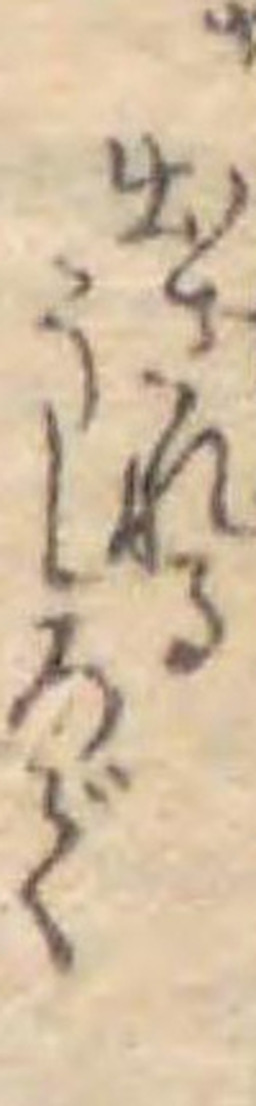うしろで
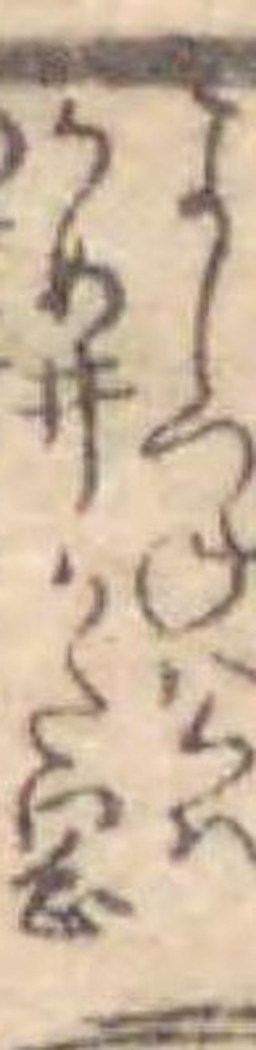かめ井かた岡
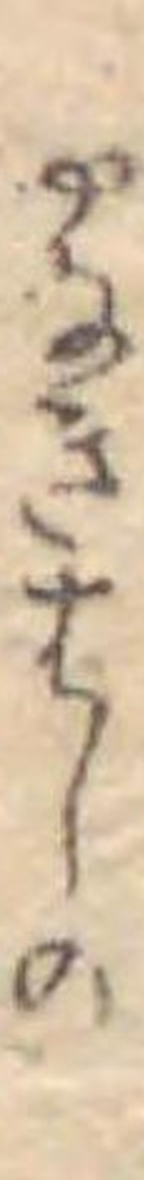やなきはしの
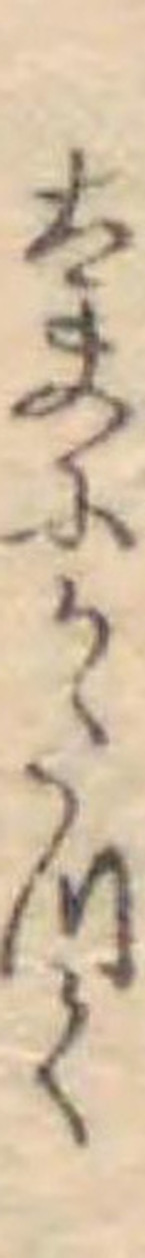太夫にかたつて
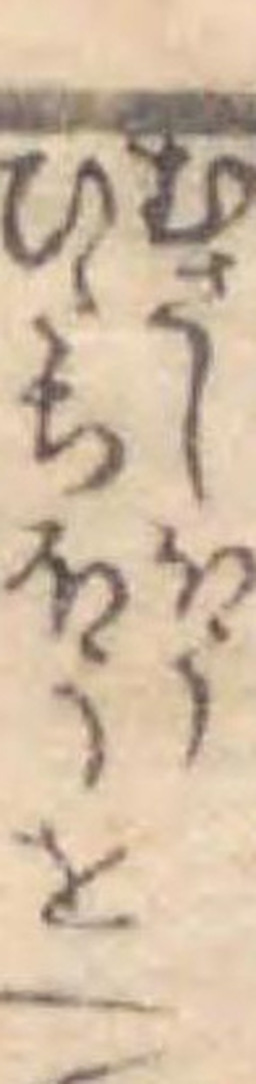ひたちほうを
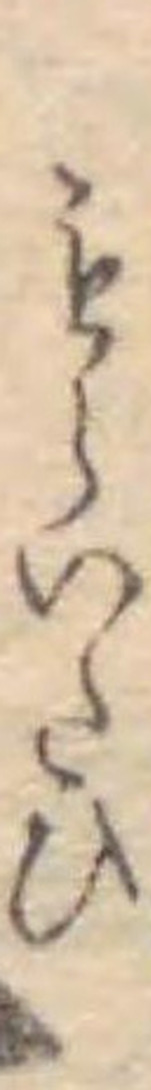もらいたひ
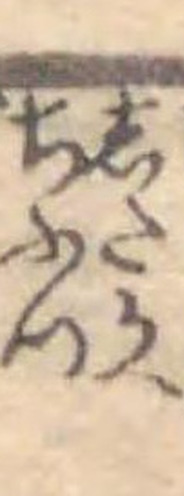ちふつ
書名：悦贔負蝦夷押領 : 3巻
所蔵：国立国会図書館 National Diet Library, JAPAN
